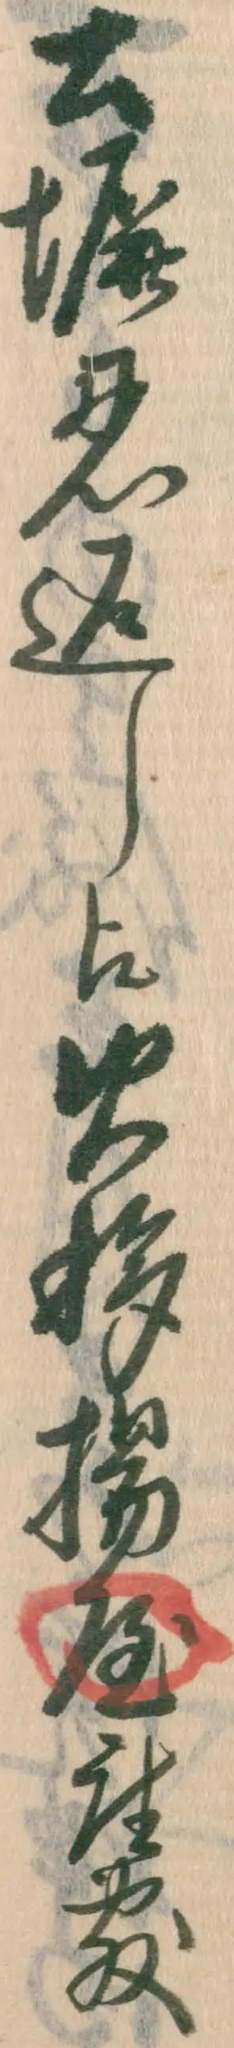土塀忍返え火移揚屋座敷
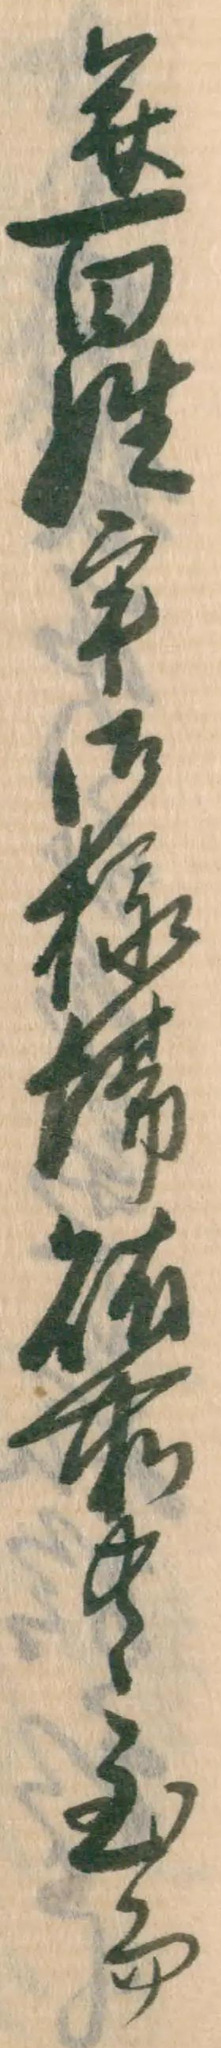幷百姓牢御様場賄所共至て
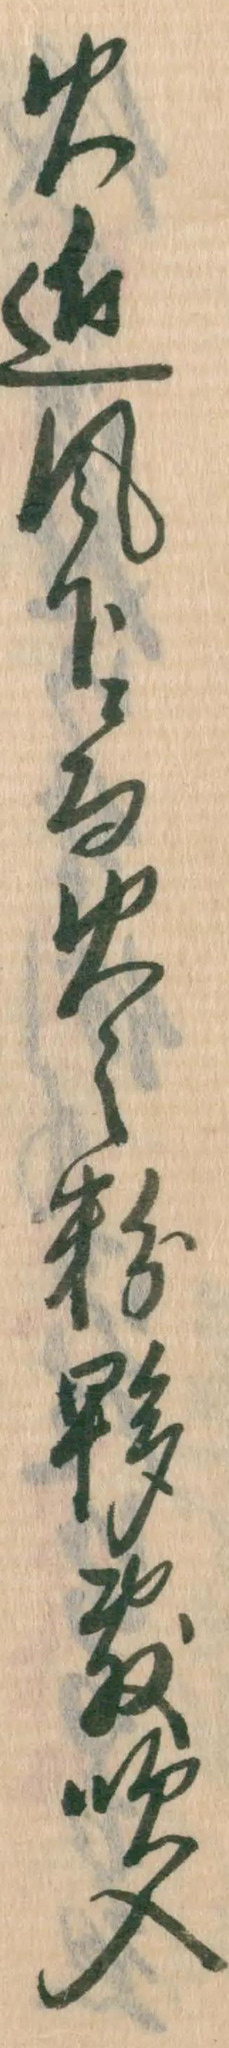火近風下ニて火之粉夥敷吹入
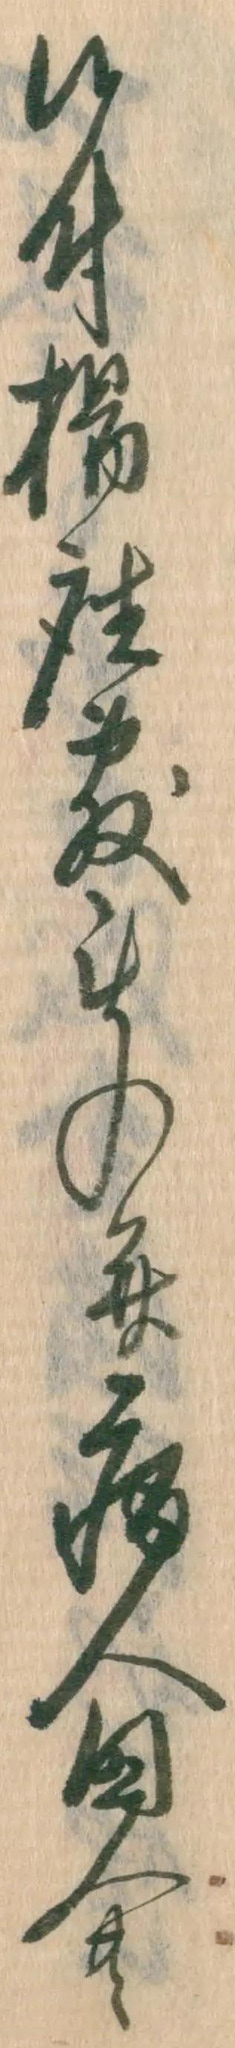候付揚座敷もの幷病人囚人共
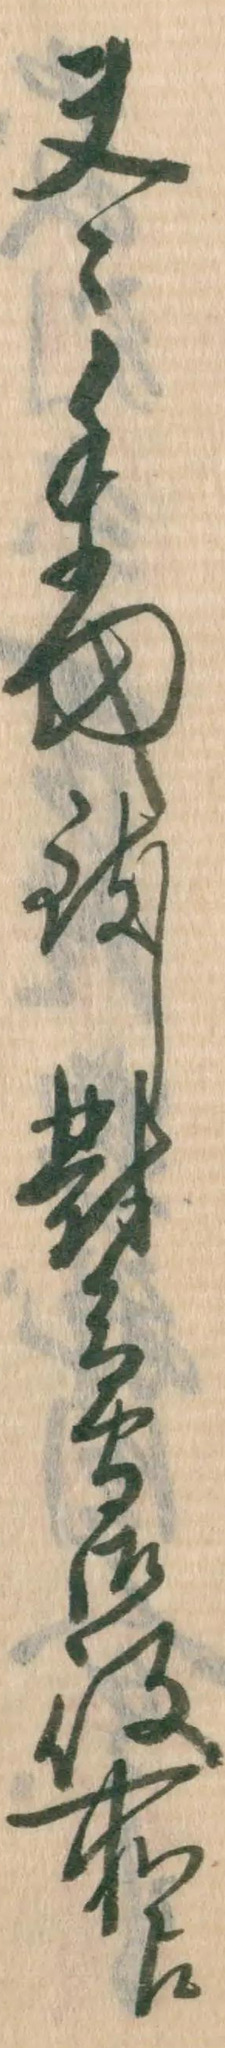夫〻手当致し対馬守御役所え
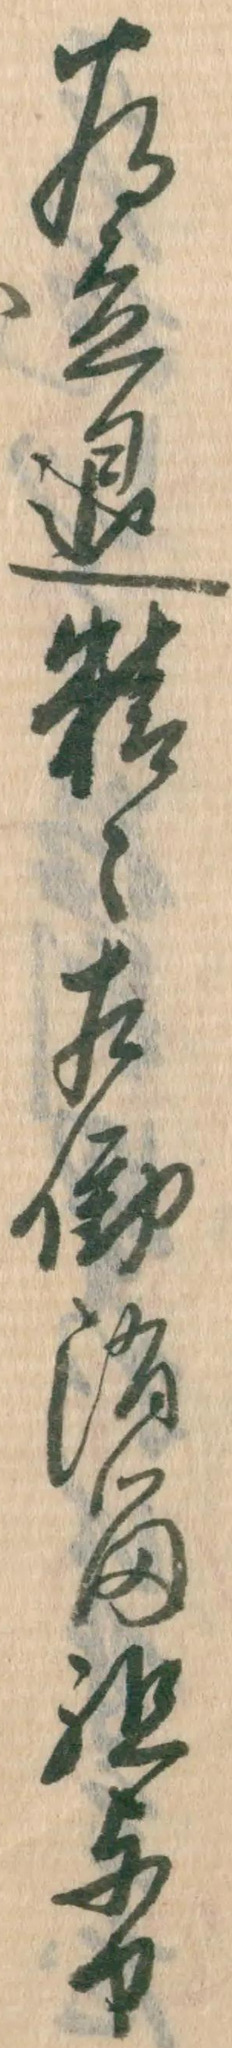為立退精〻相働消留組与力

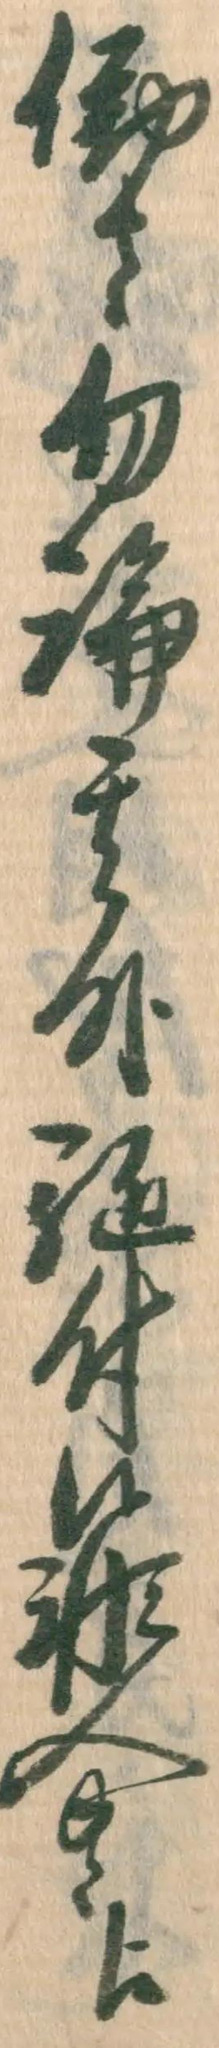働は勿論其外駆付候非人共え
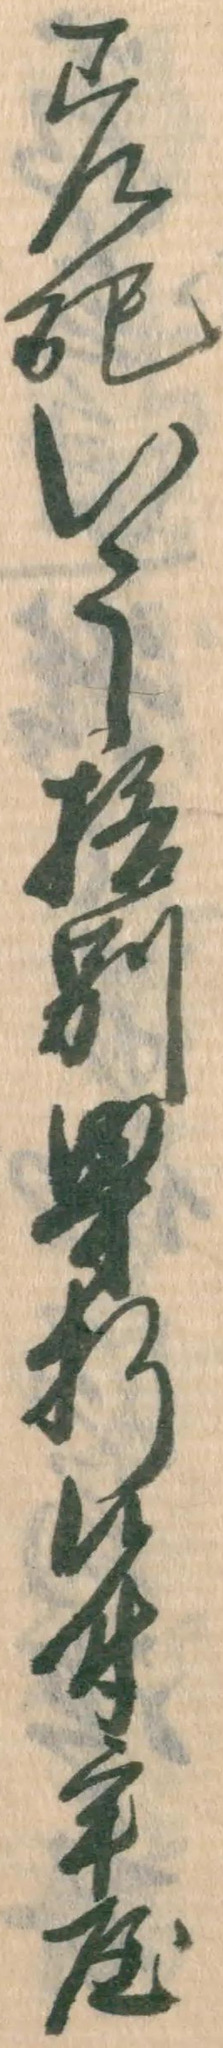差配いたし格別骨折候付牢屋
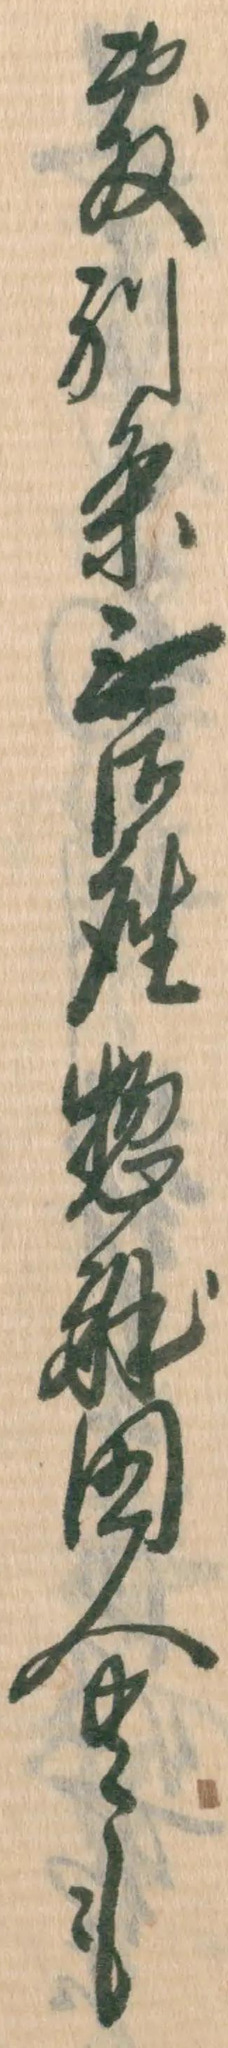敷別条無御座惣体囚人共も
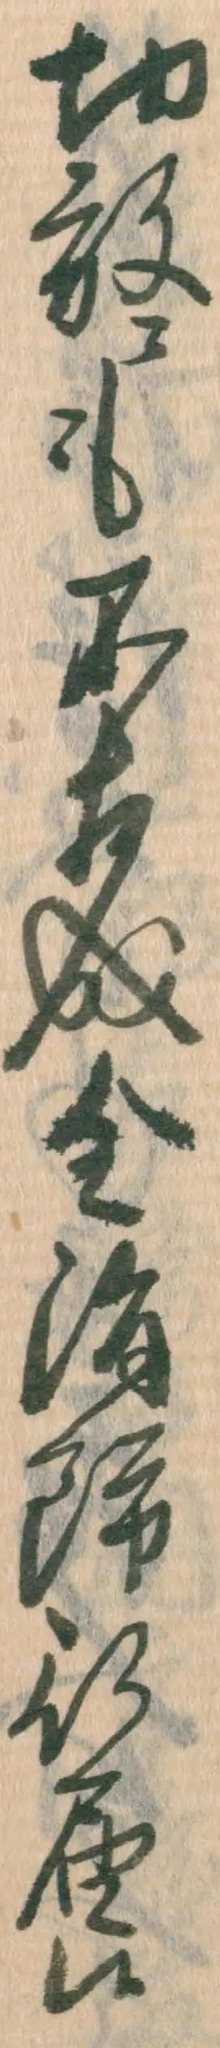切放ニも不相成全消防行届候
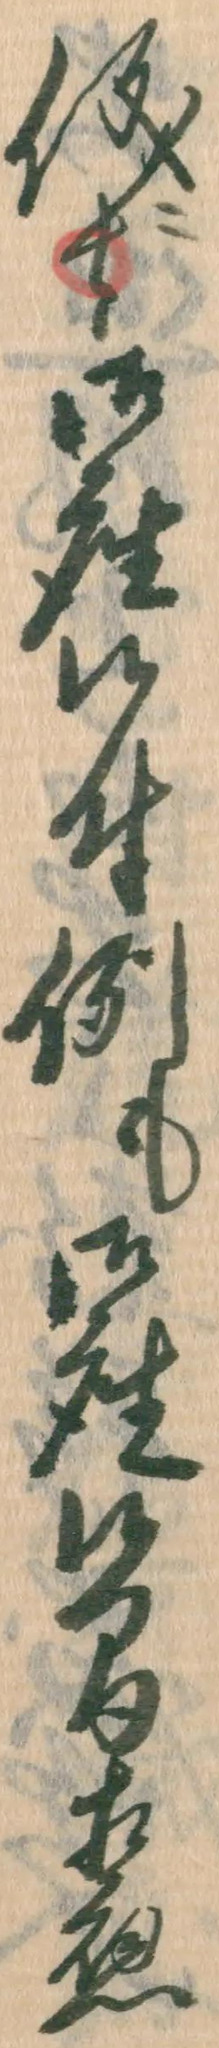儀ニは御座候付例も御座候間相応
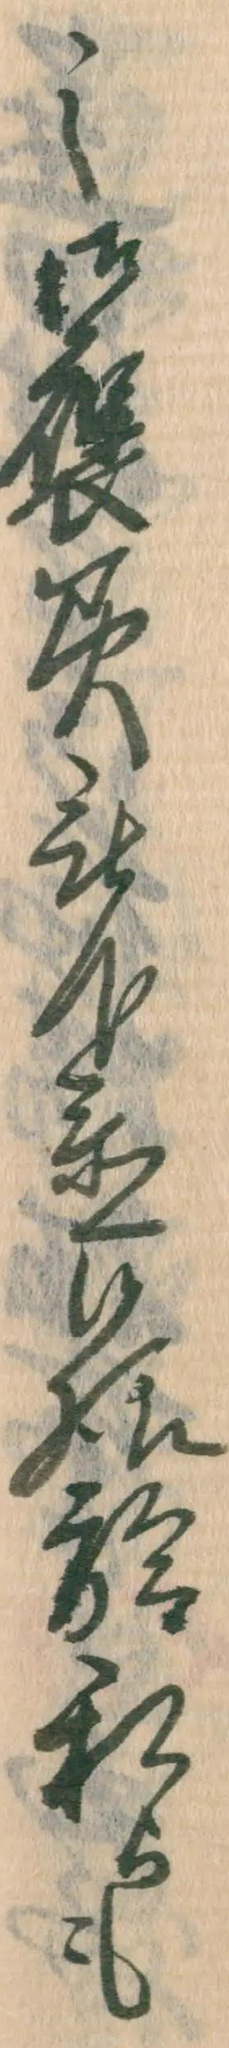之御褒美被下置候様於私共も
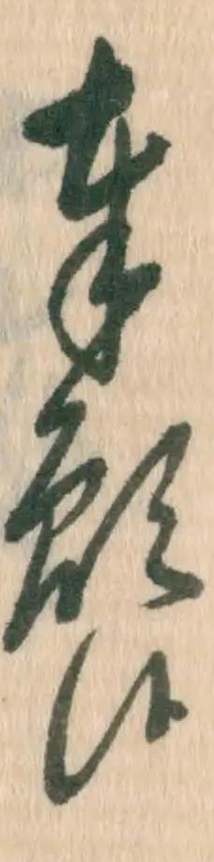奉願候
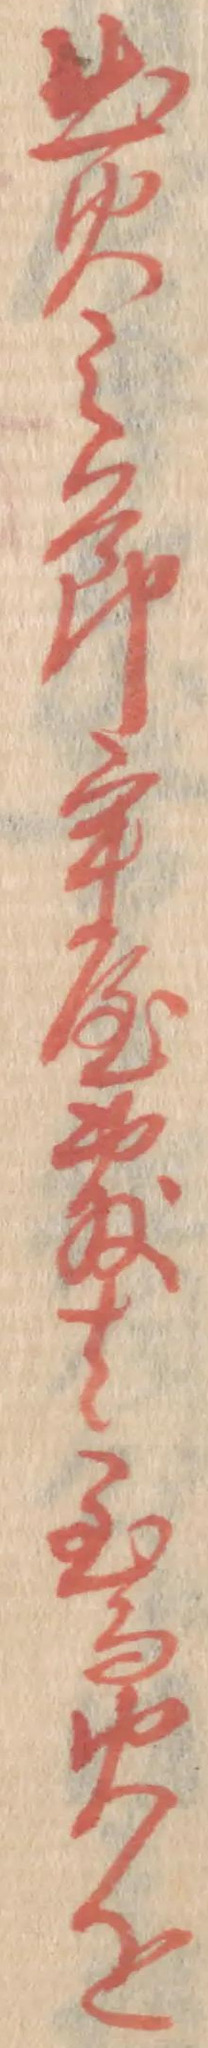出火之節牢屋敷は至て火近
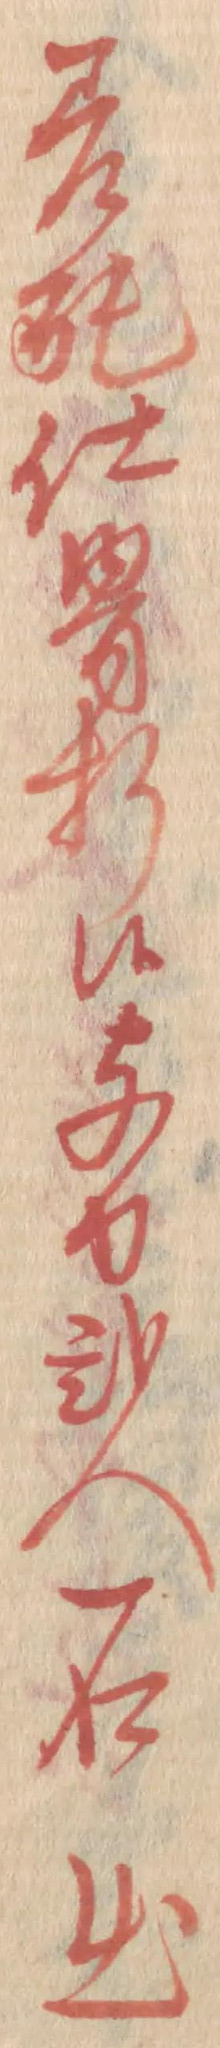差配仕骨折候与力弐人石出
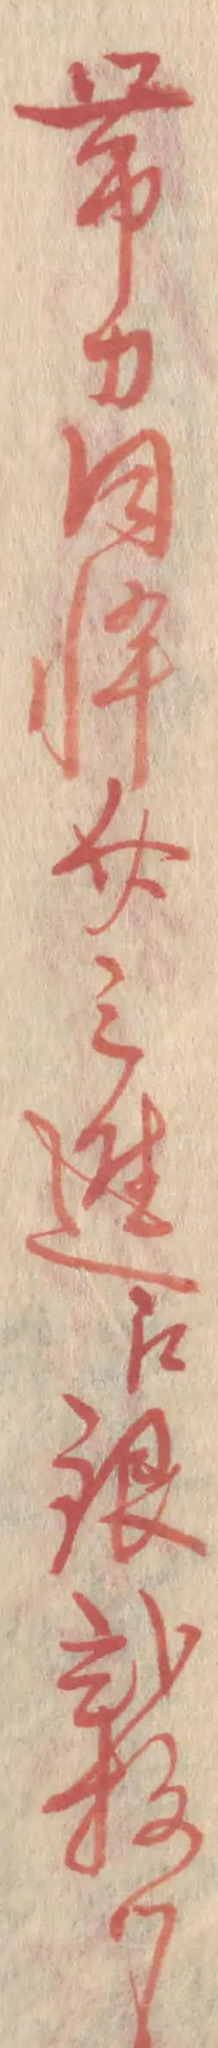帯刀堂悴弁之進え銀弐枚ツヽ
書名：七十冊物類集 71巻. [44] 四十三 牢屋敷御普請御修覆地震ニ付骨折候牢屋掛御褒美之部
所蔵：国立国会図書館 National Diet Library, JAPAN
